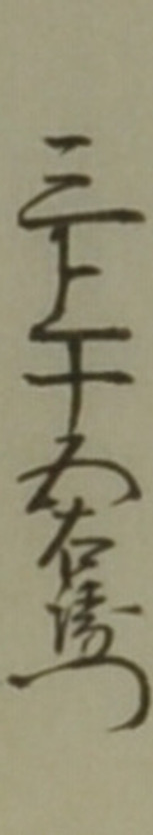三上十五右衛門
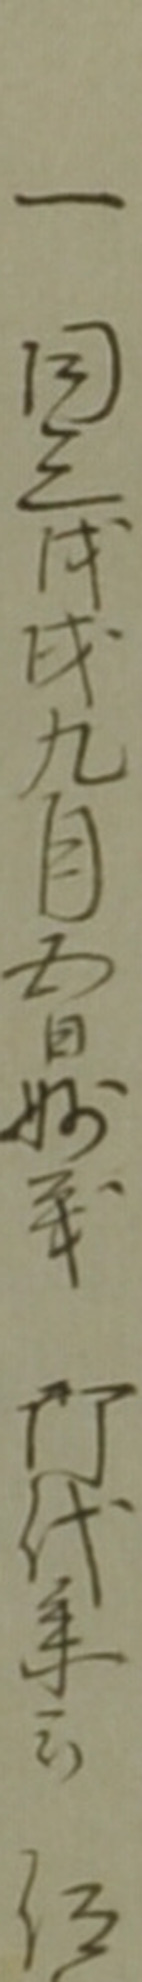一同三戊戌九月五日妙義御代参被仰付
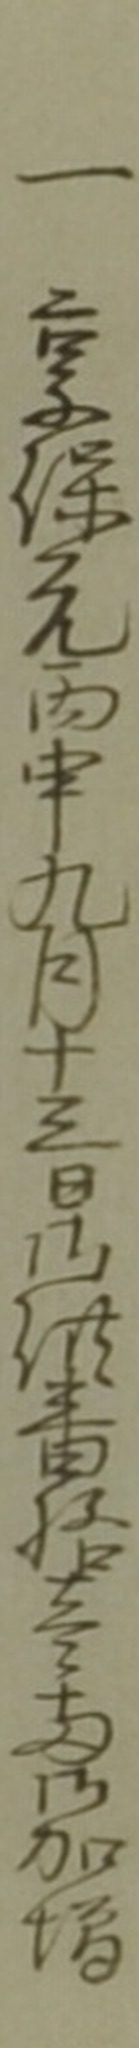一享保元丙申九月十三日御供番格壱両御加増
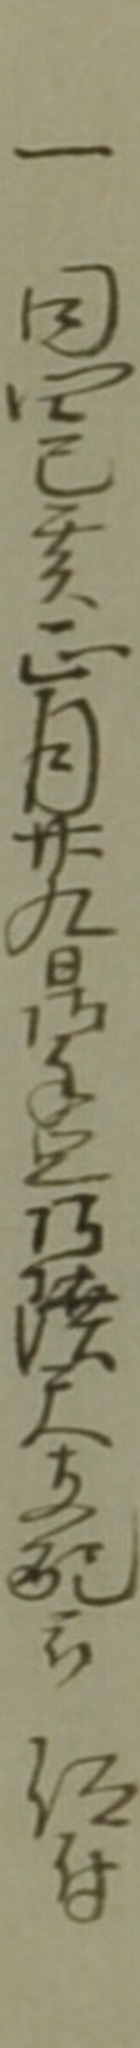一同四己亥正月廿九日御手廻御陸尺支配被仰付
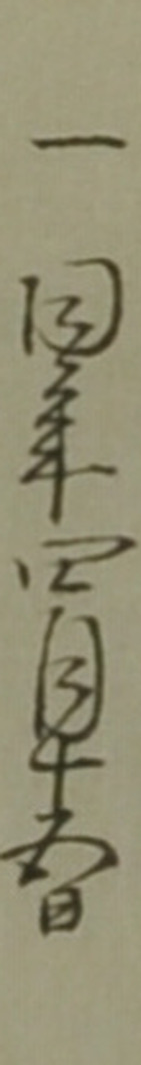一同年四月十五日
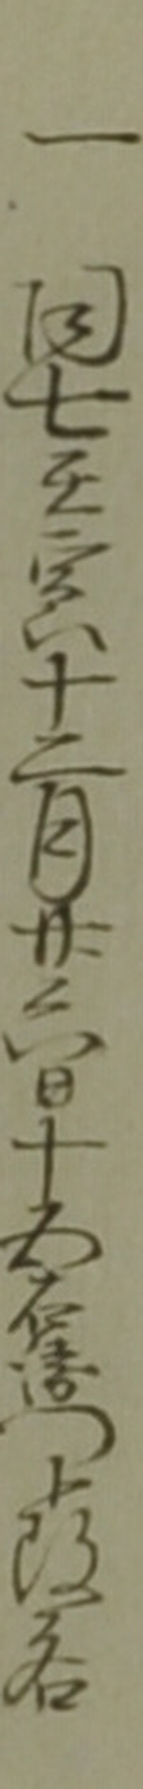一同七壬寅十二月廿六日十五右衛門改名
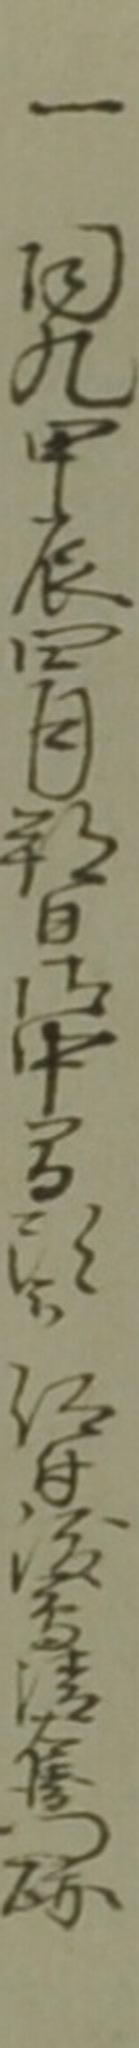一同九甲辰四月朔日御中間頭被仰付渡辺清右衛門跡
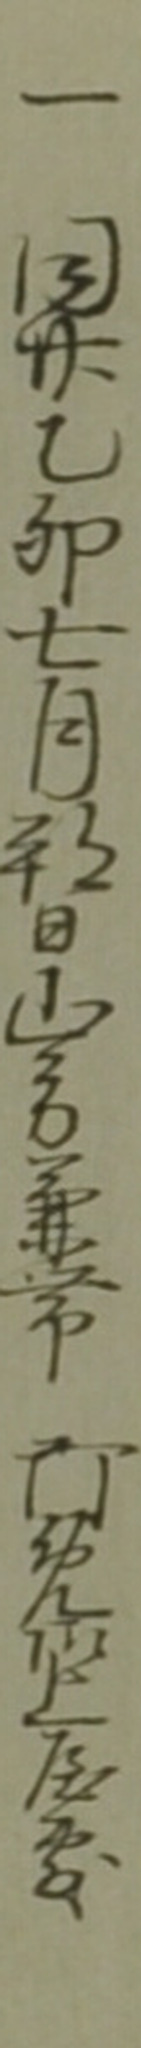一同廿乙卯七月朔日山方兼帯御免御上屋敷
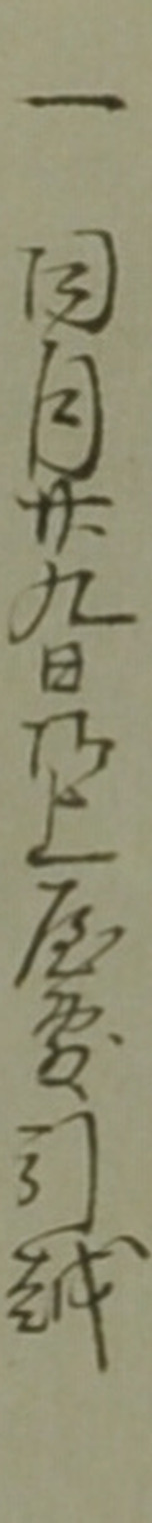一同月廿九日御上屋敷引越
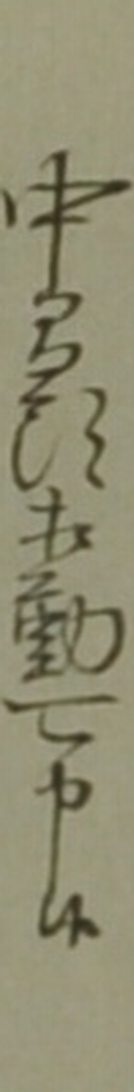中間頭相勤可申候
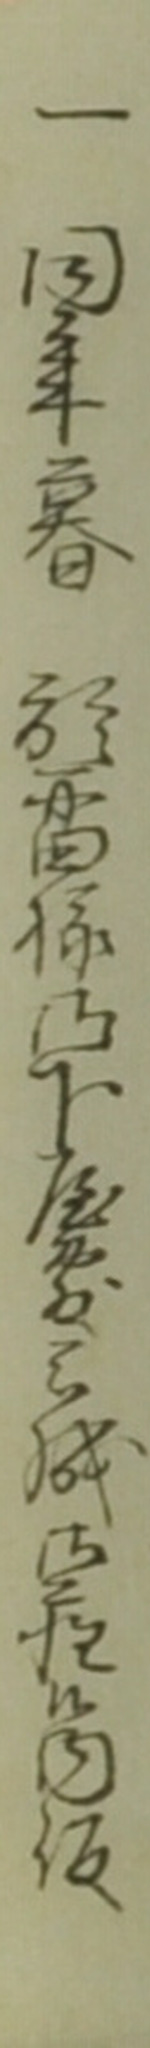一同年暮於留様御下屋敷被成御座候内仮
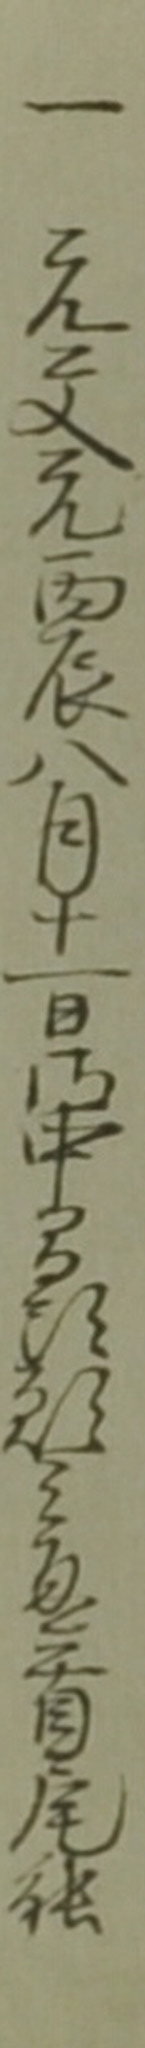一元文元丙辰八月十一日御中間頭願之通首尾能
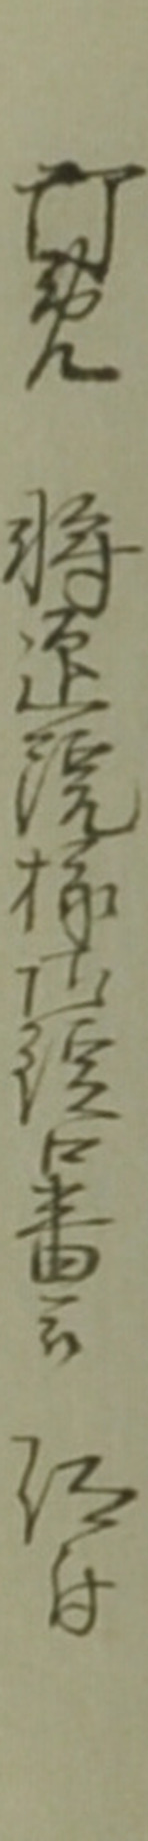御免将迎院様御錠口番被仰付

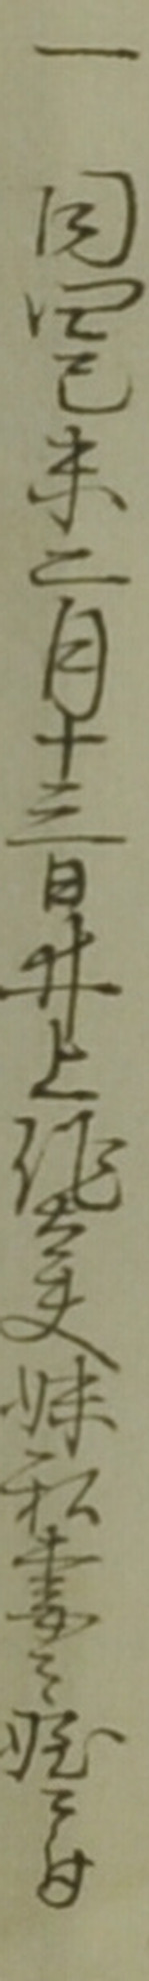一同四己未二月十三日井上作太夫妹私妻之姪ニ付
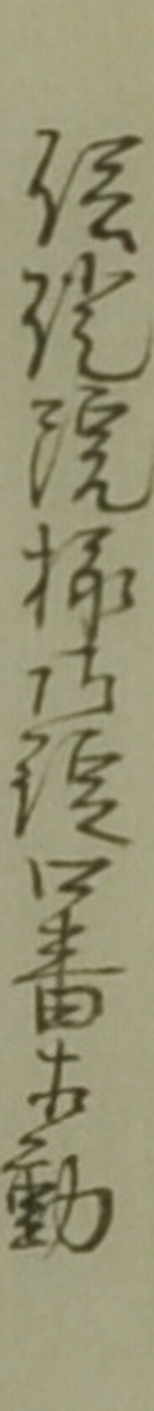信証院様御錠口番相勤
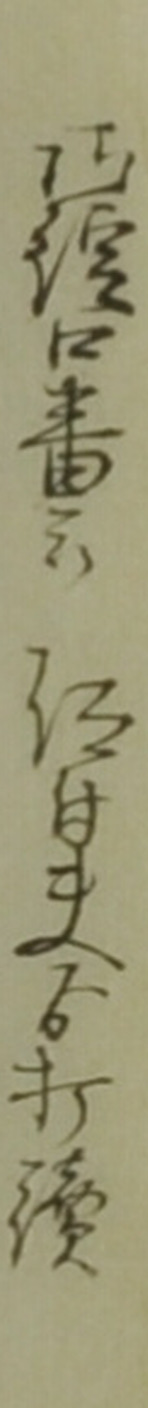御錠口番被仰付夫ゟ打続
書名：無足廃家（弐）
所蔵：伊那市立高遠町図書館・合同会社AMANE
